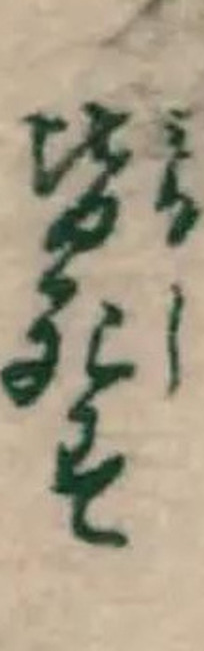皆死す
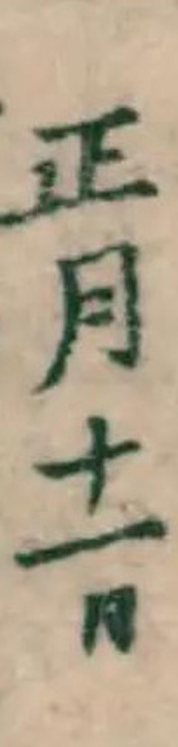正月十一日
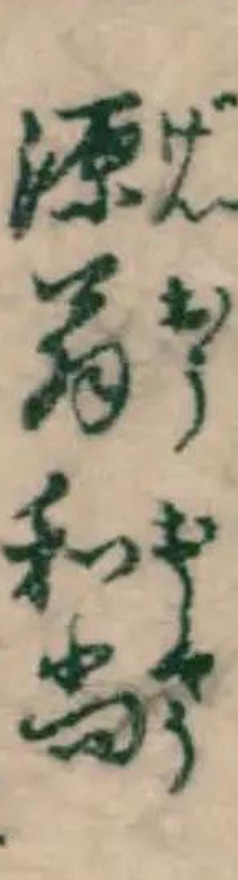源翁和尚
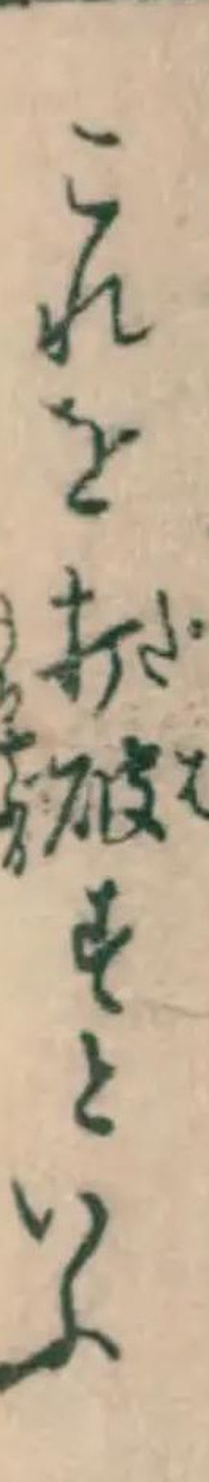これを打破すといふ
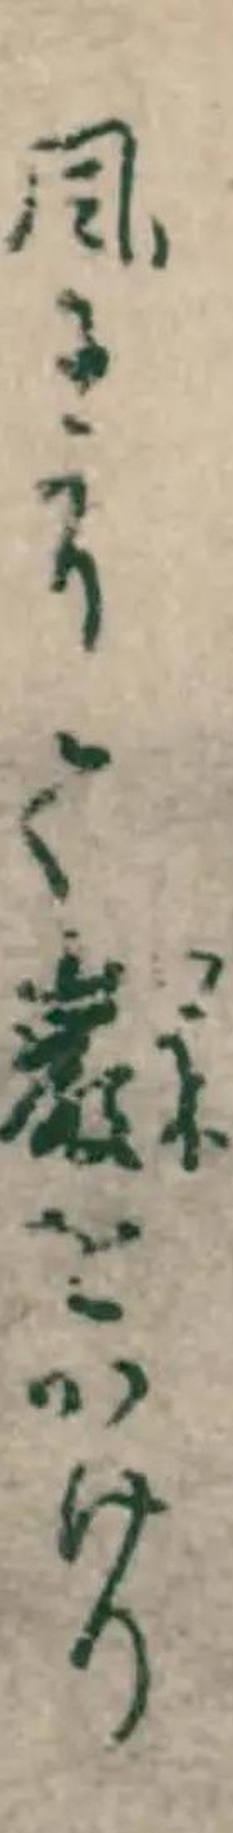風によりて巌をかけり
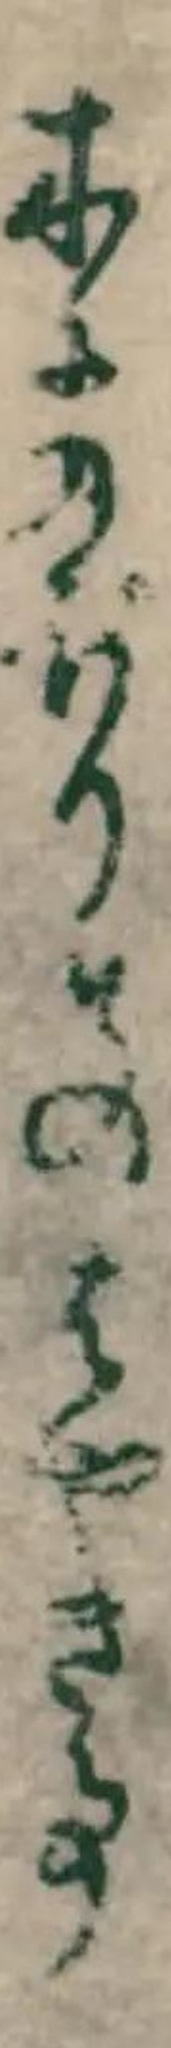木にのぼりそのはやき事
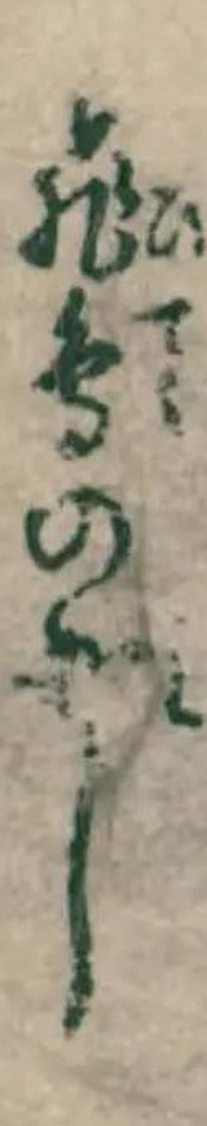飛鳥の如し

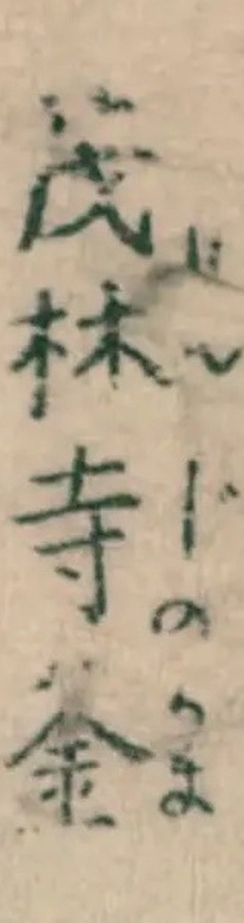茂林寺釜
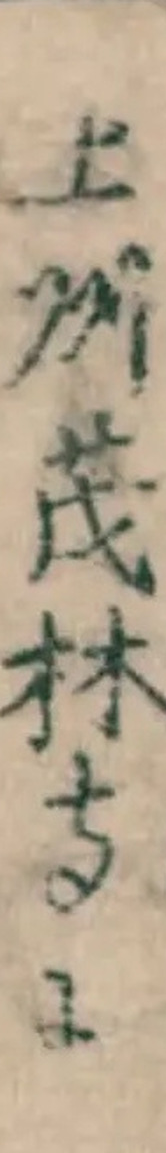上州茂林寺に
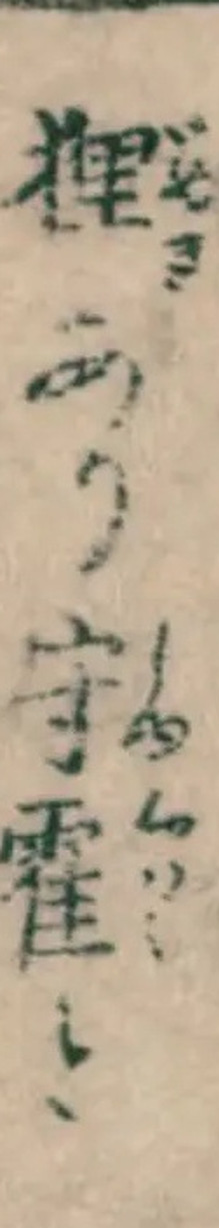狸あり守霍と
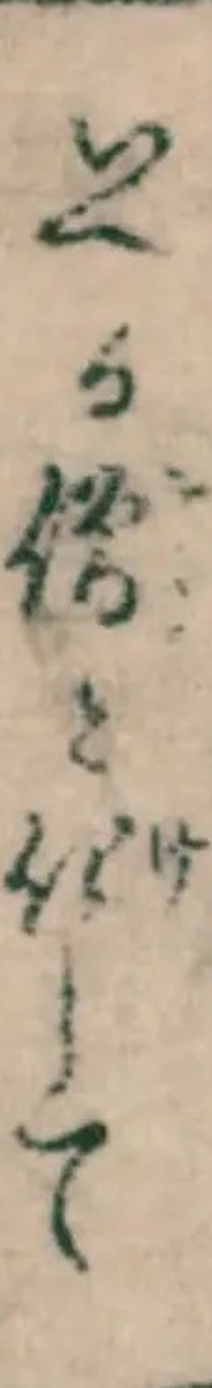いへる僧と化して
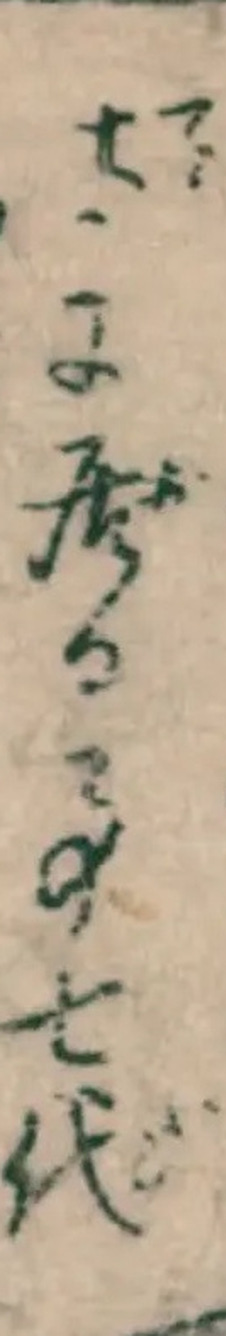寺に居る事七代
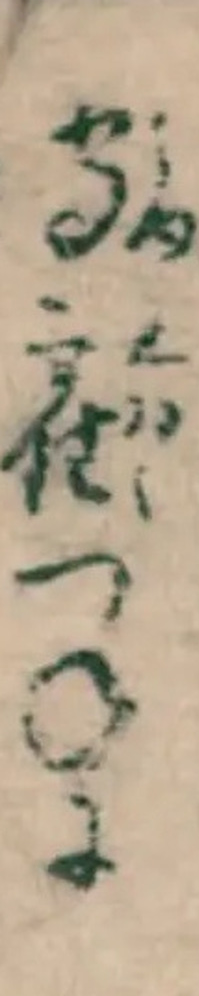守霍つねに
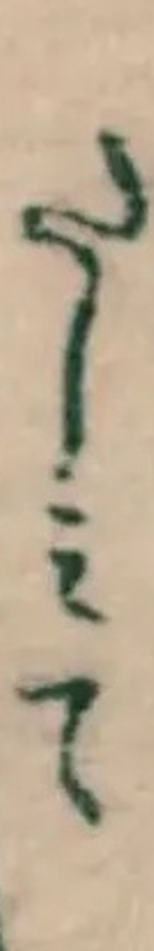たしみて
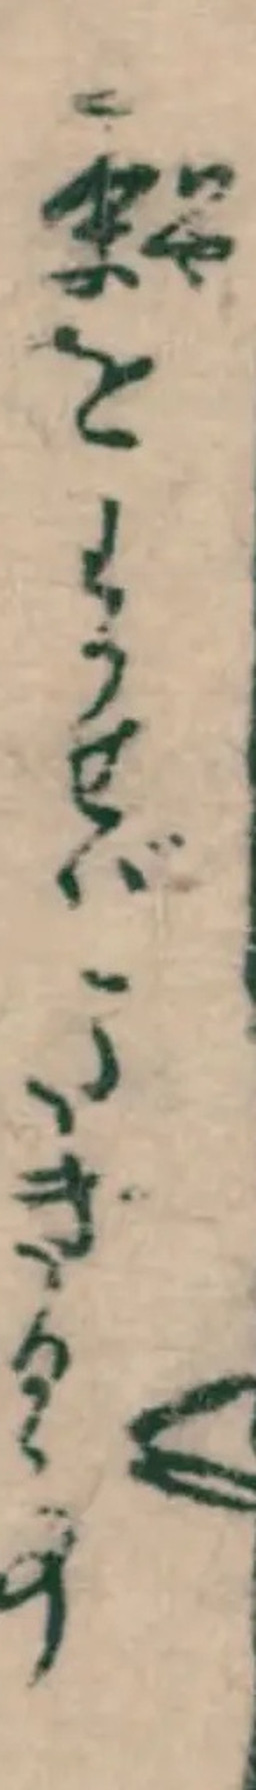茶をわかせばたぎる事
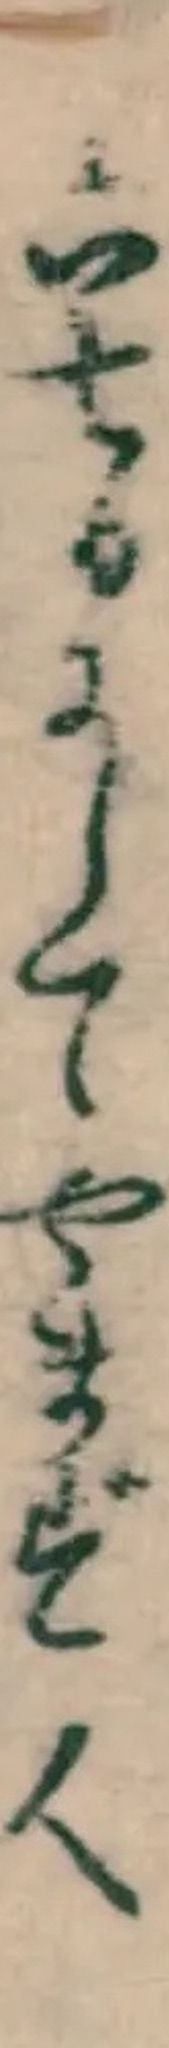六七日にしてやまず人
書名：百鬼夜行 3巻拾遺3巻. [2]
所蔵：国立国会図書館 National Diet Library, JAPAN
